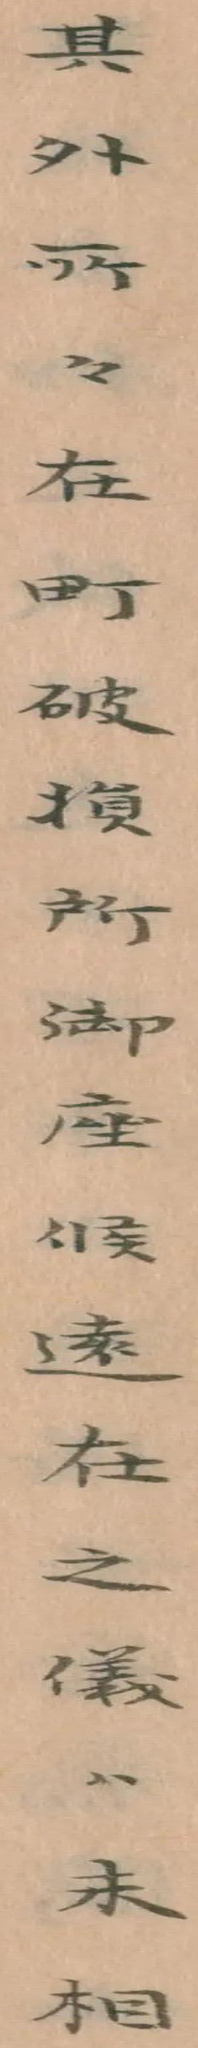其外所々在町破損所御座候遠在之儀ハ未相
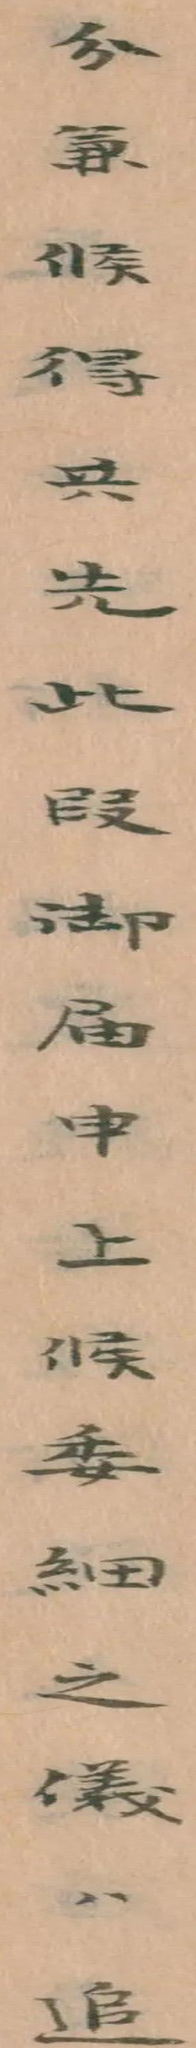分兼候得共先此段御届申上候委細之儀ハ追
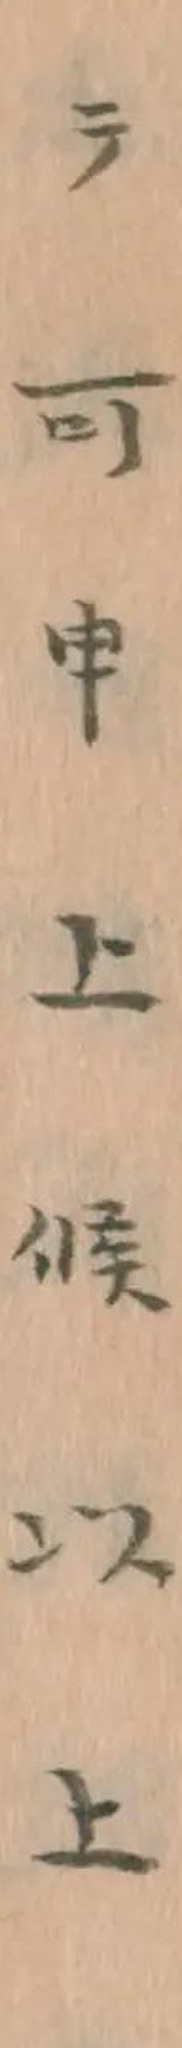テ可申上候以上
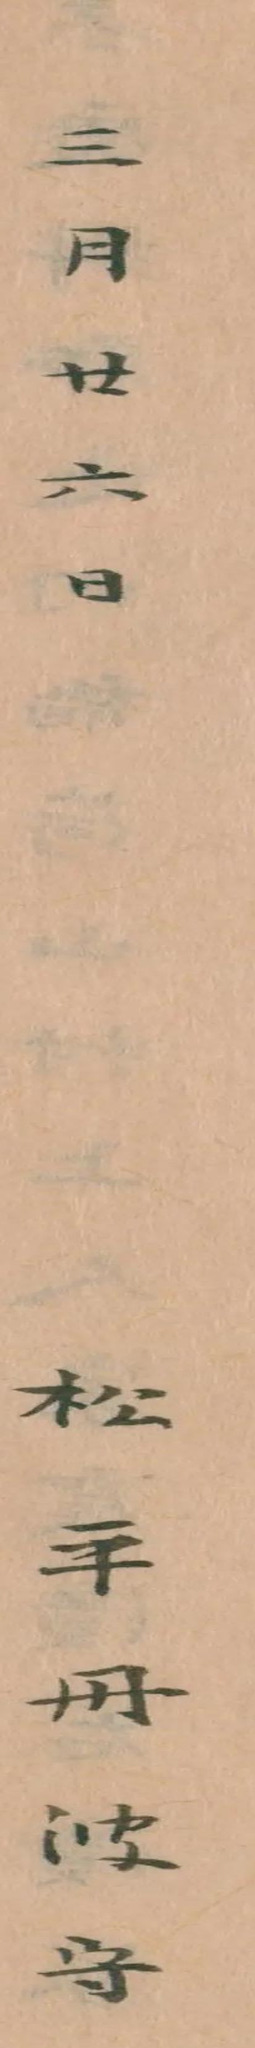三月廿六日松平丹波守
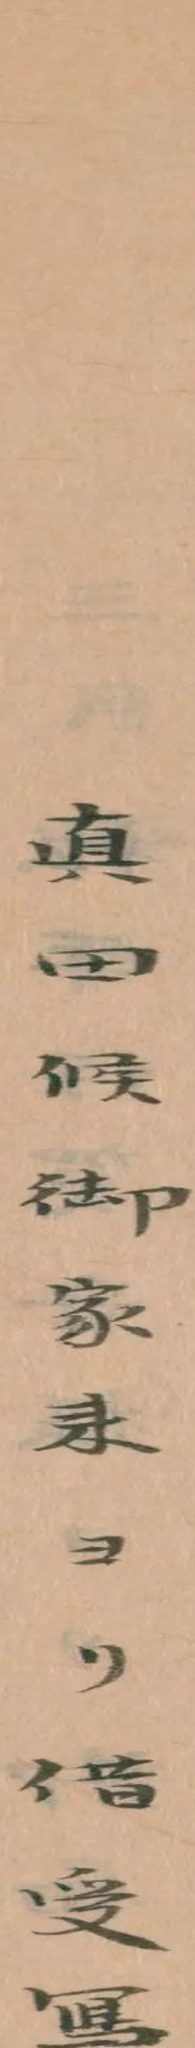真田候御家来ヨリ借受写
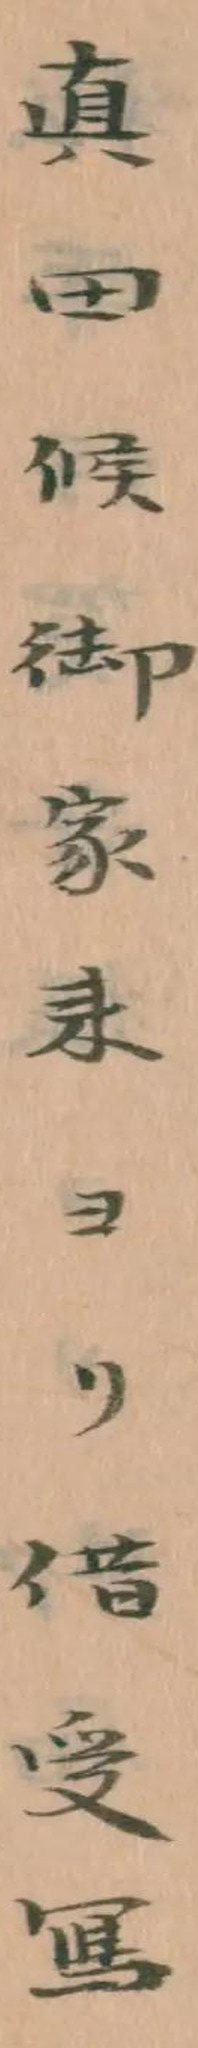真田候御家来ヨリ借受写
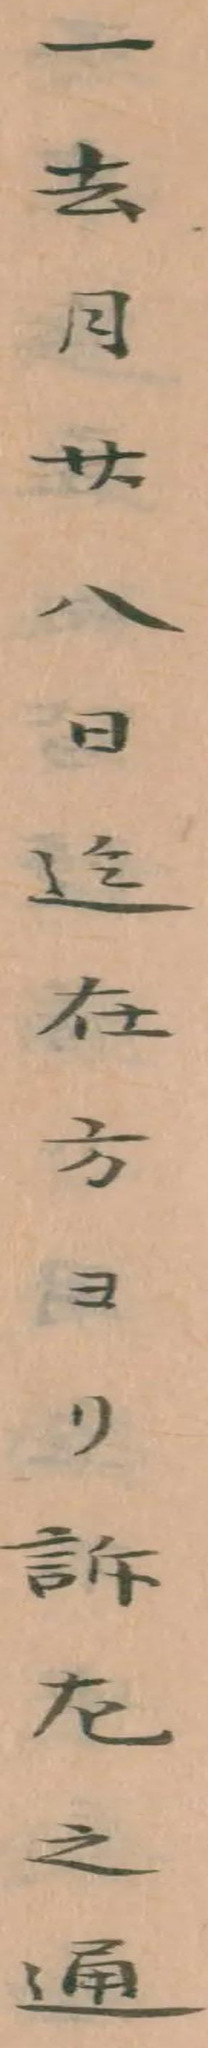一去月廿八日迄在方ヨリ訴左之通
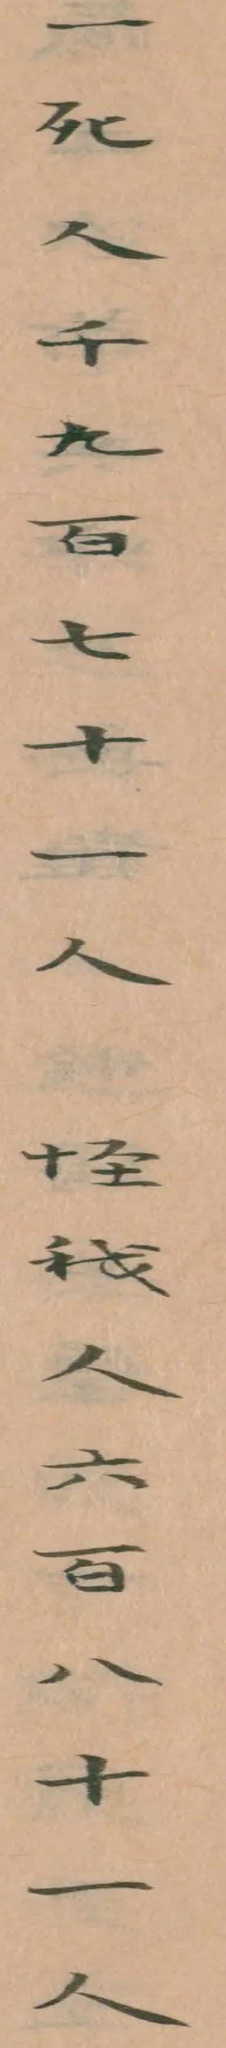一死人千九百七十一にん怪我人六百八十一人
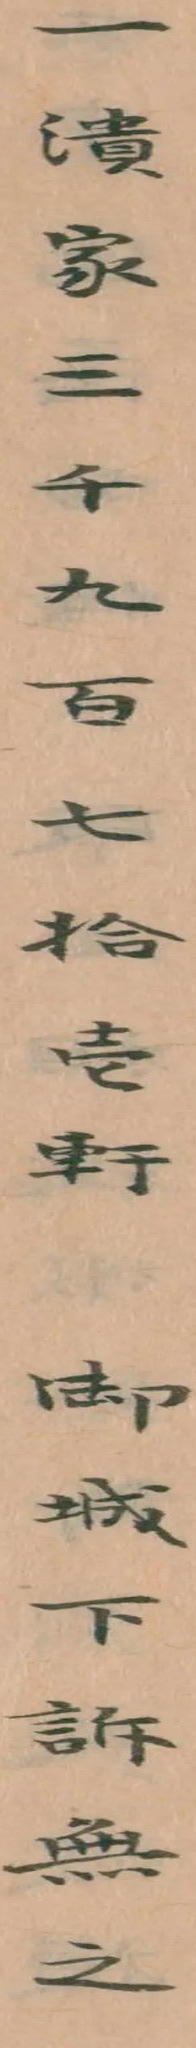一潰家三千九百七拾壱軒御城下訴無之
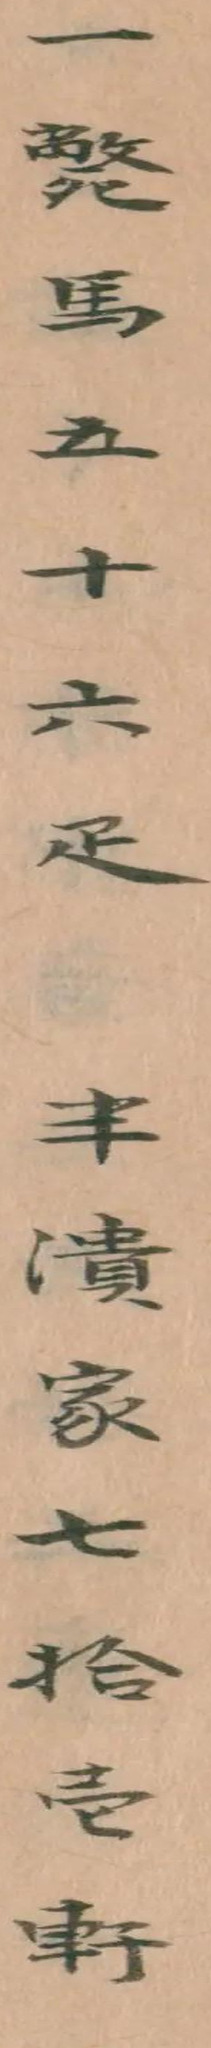一斃馬五十六疋半潰家七拾壱軒
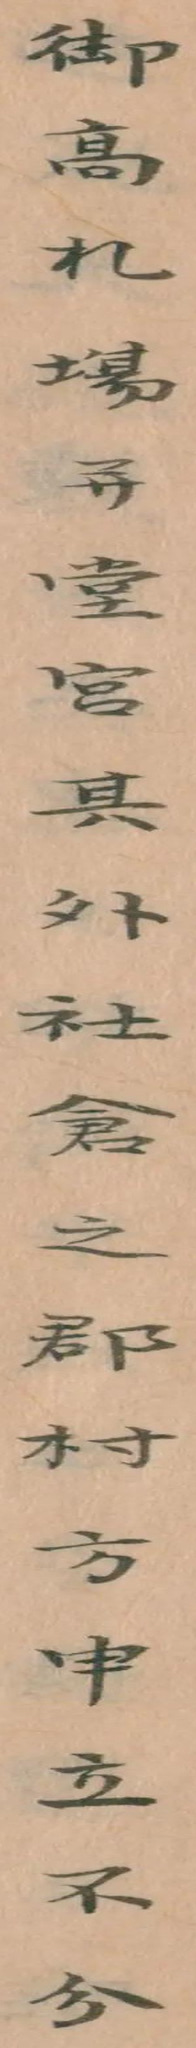御高札場并堂宮其外社倉之郡村方申立不分
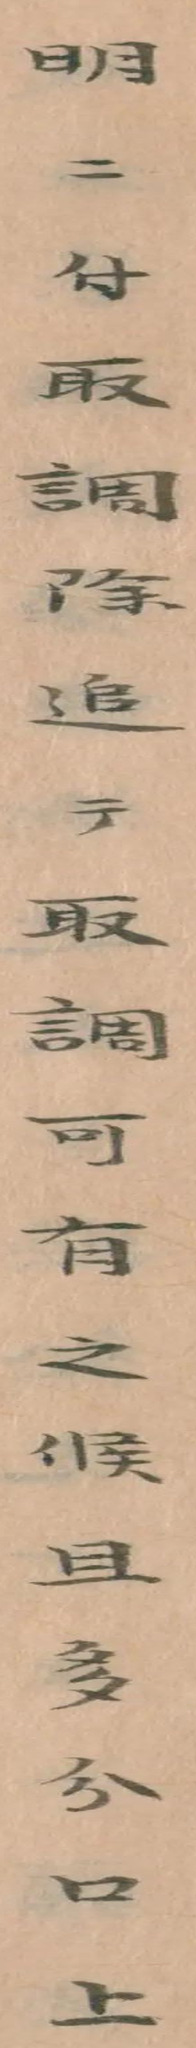明二付取調除追テ取調可有之候且多分口上
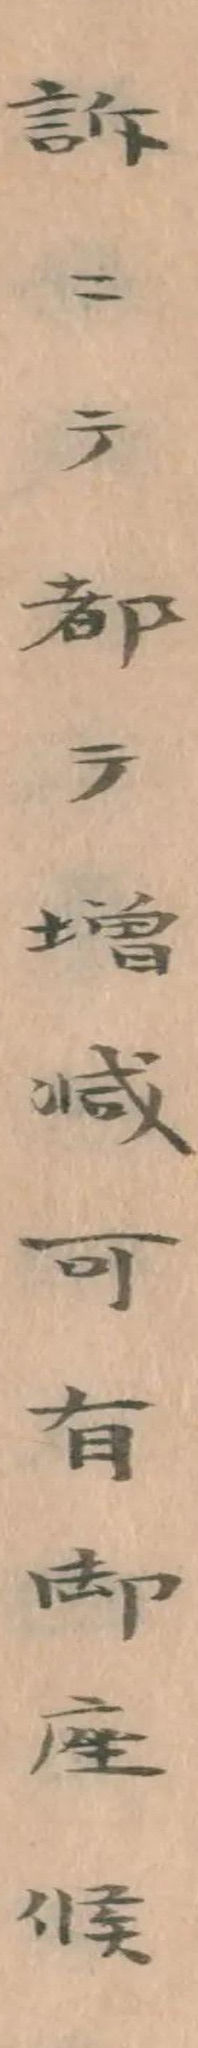訴ニテ都て増減可有御座候
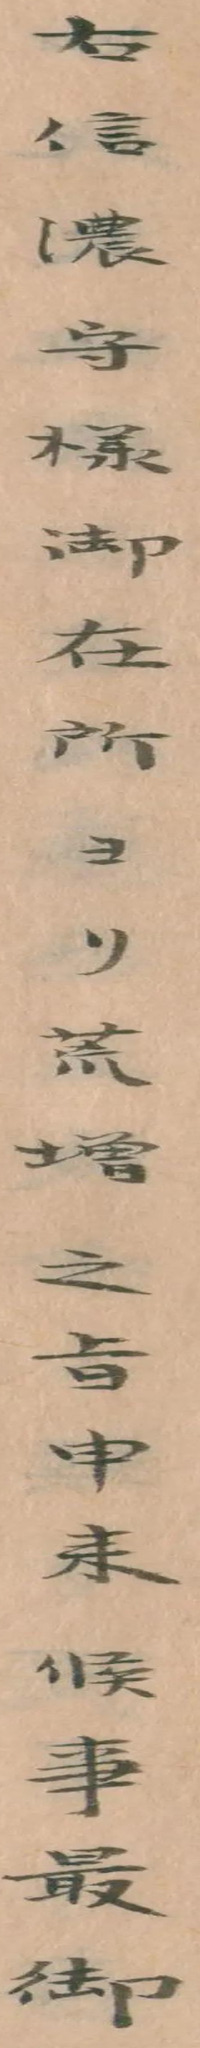右信濃守様御在所ヨリ荒増之旨申来候事最御
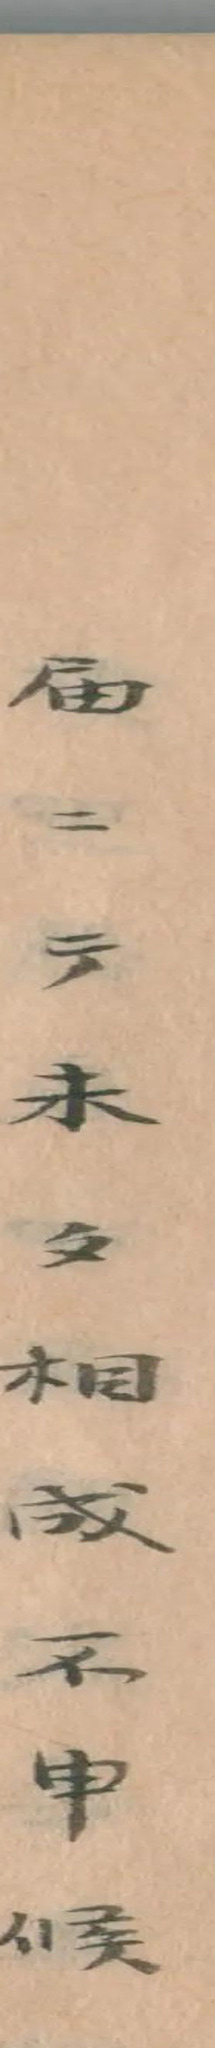届ニテ未タ相成不申候
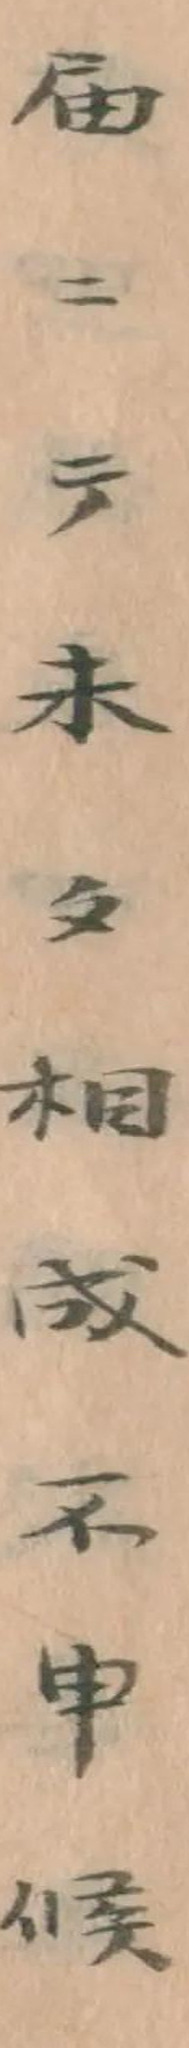届ニテ未タ相成不申候
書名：地災撮要. 巻1(噴火山・地震ノ部)
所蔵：国立国会図書館 National Diet Library, JAPAN
